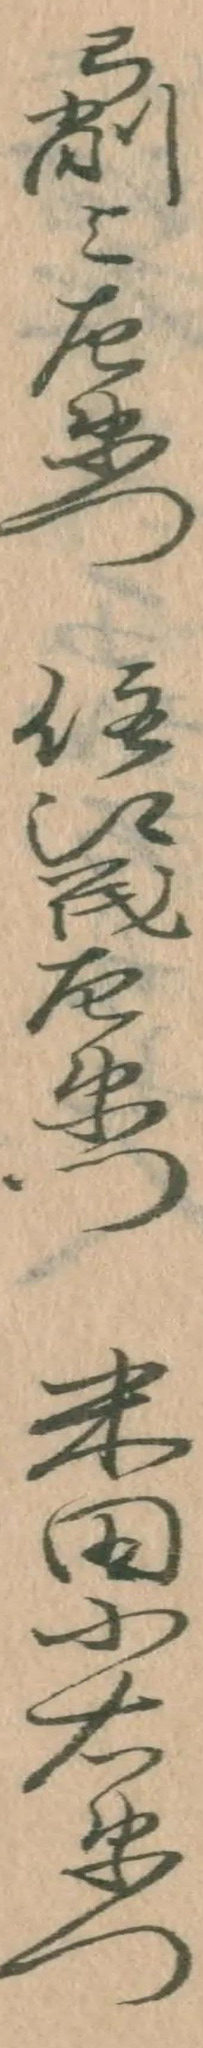弓削与左衛門住江茂左衛門米田小右衛門
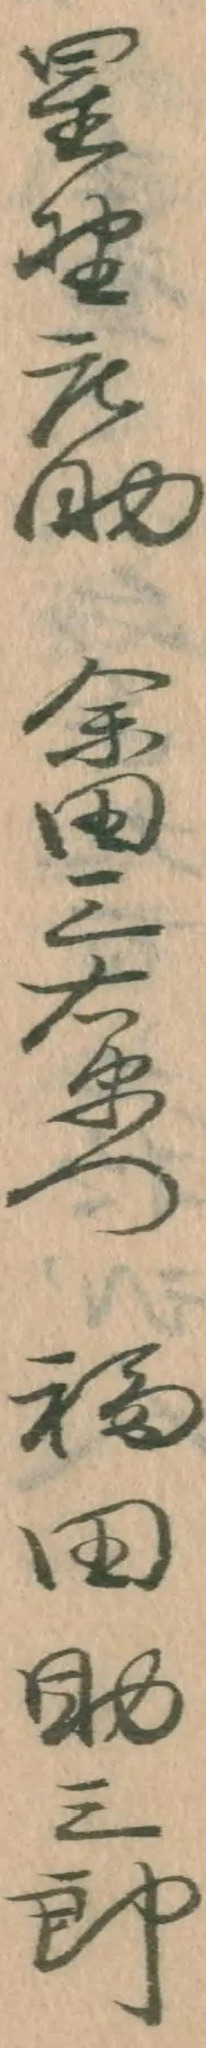星野庄助余田三右衛門福田助三郎
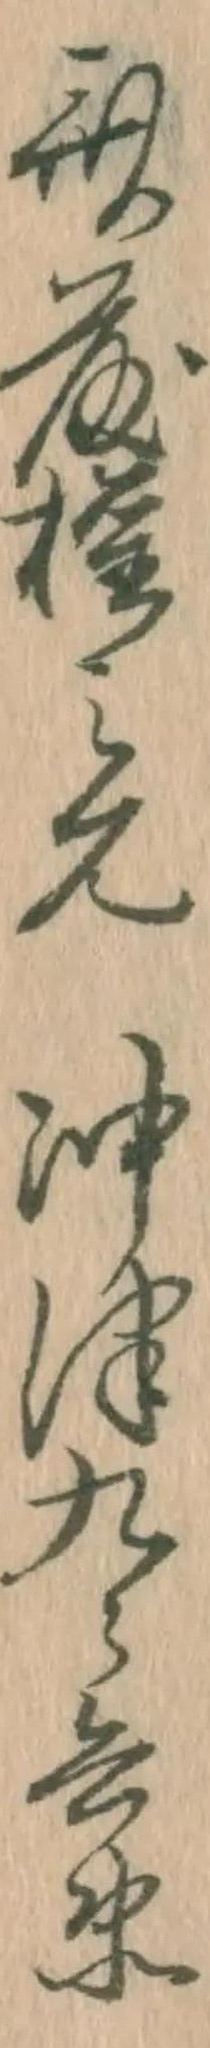斎藤権之允興津九郎兵衛
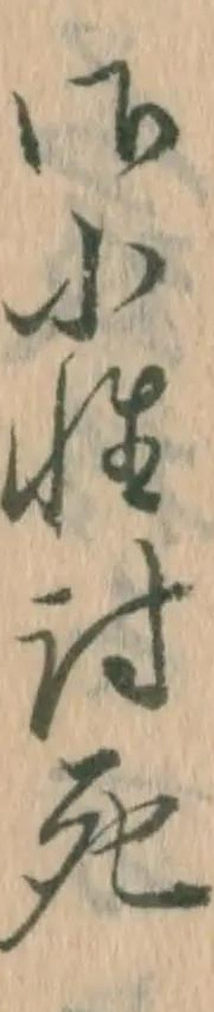御小姓討死
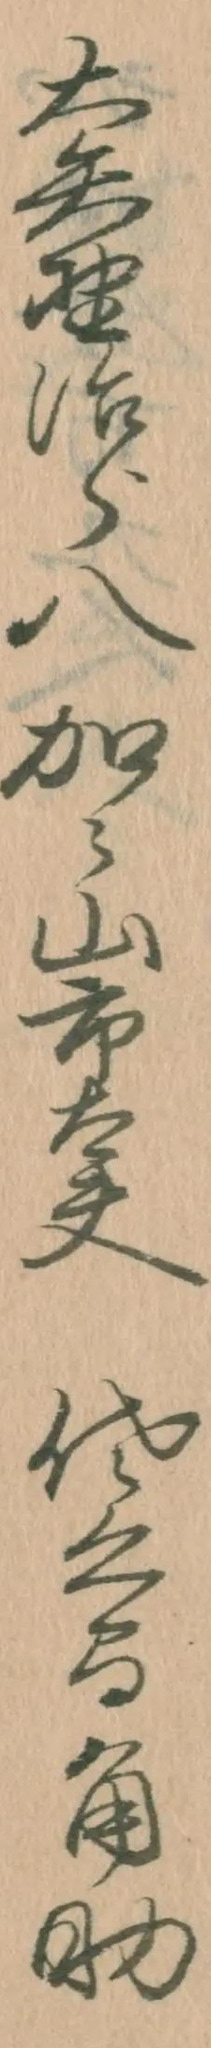大矢野治郎八加々山市太夫佐久間角助
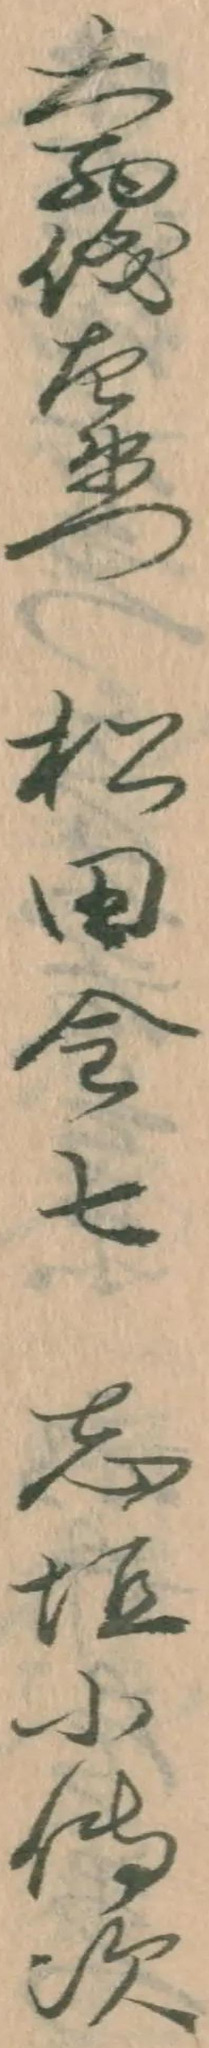大西儀左衛門松田金七志垣小伝次
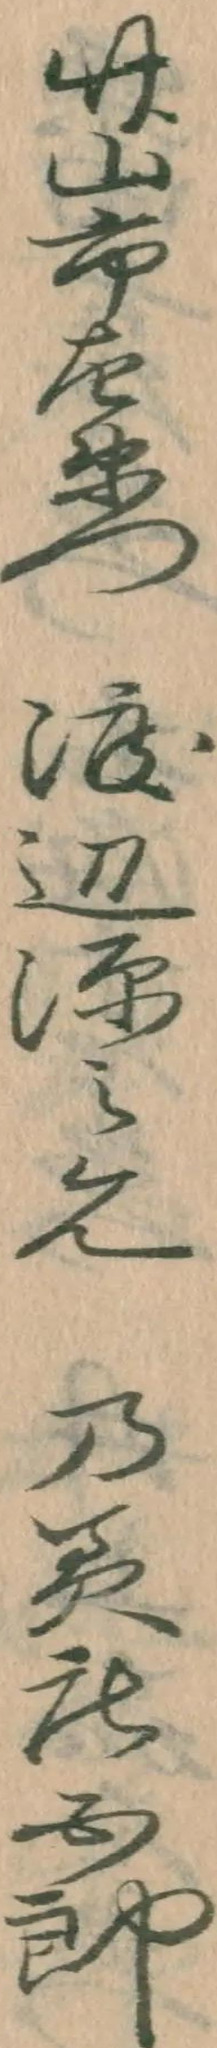竹山市左衛門渡辺源之允乃美庄五郎
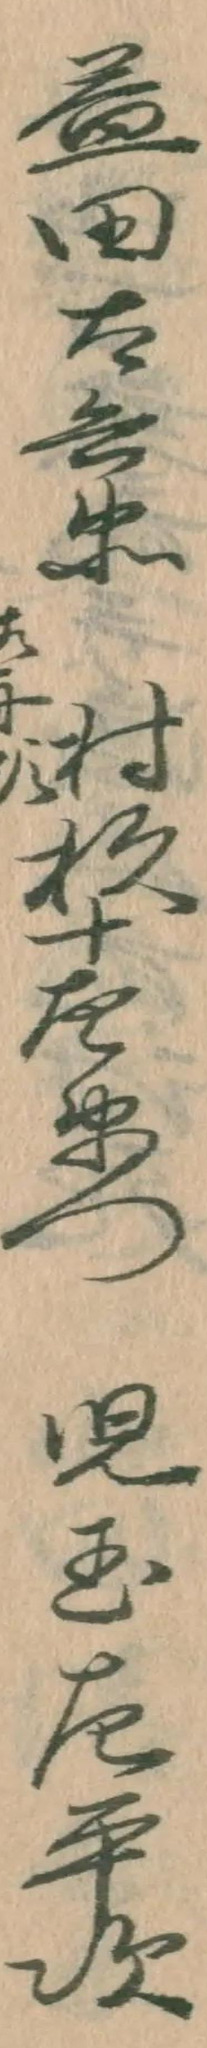増田太兵衛村杉十左衛門児玉左平次
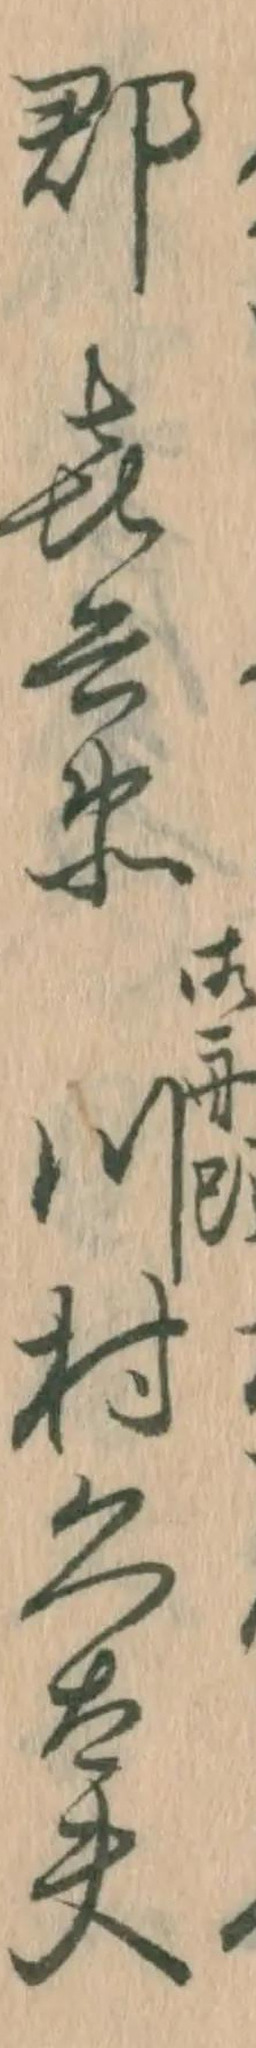郡喜兵衛川村久太夫
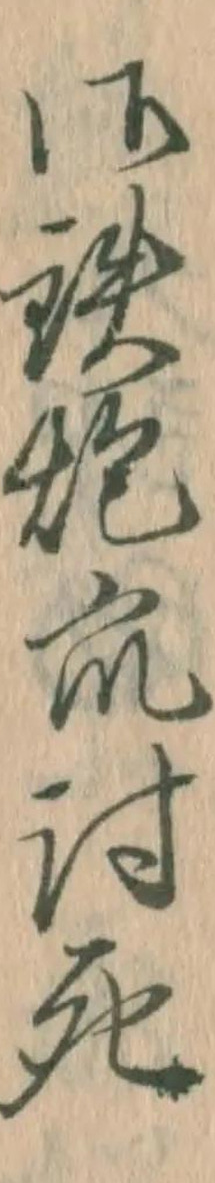御鉄砲衆討死
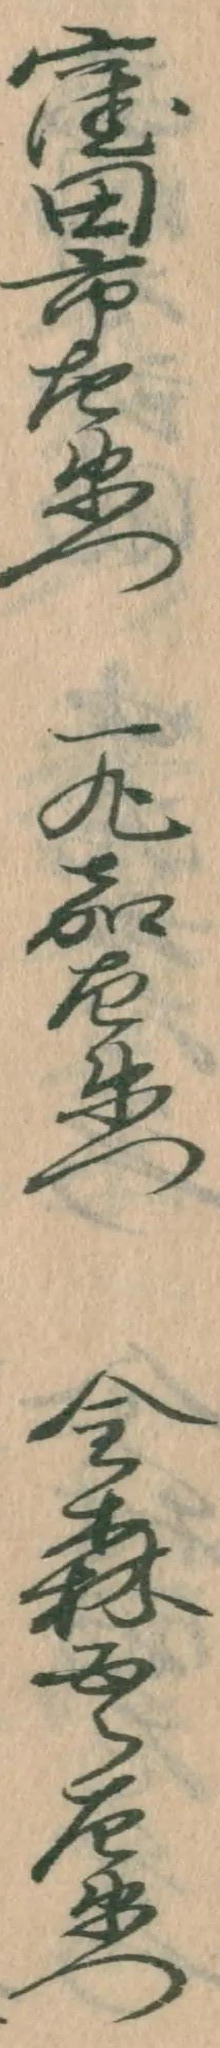窪田市左衛門一丸嘉左衛門金森五郎左衛門
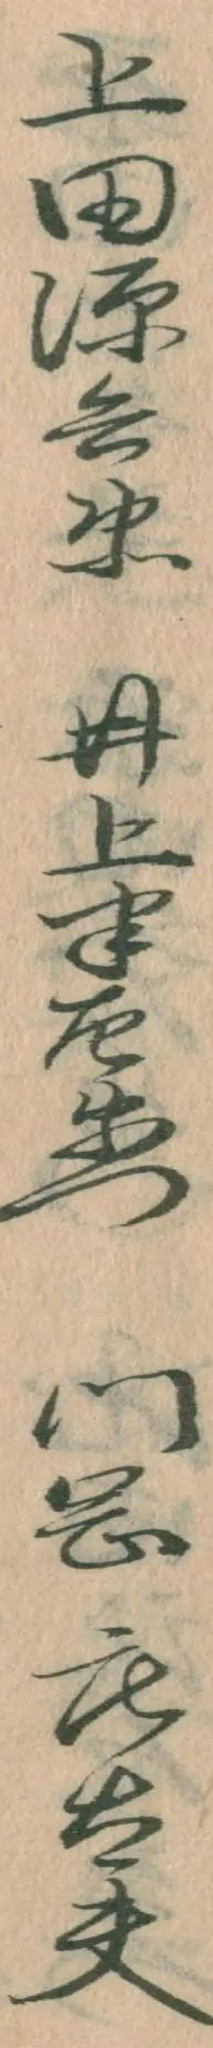上田源兵衛井上半左衛門門岡庄太夫
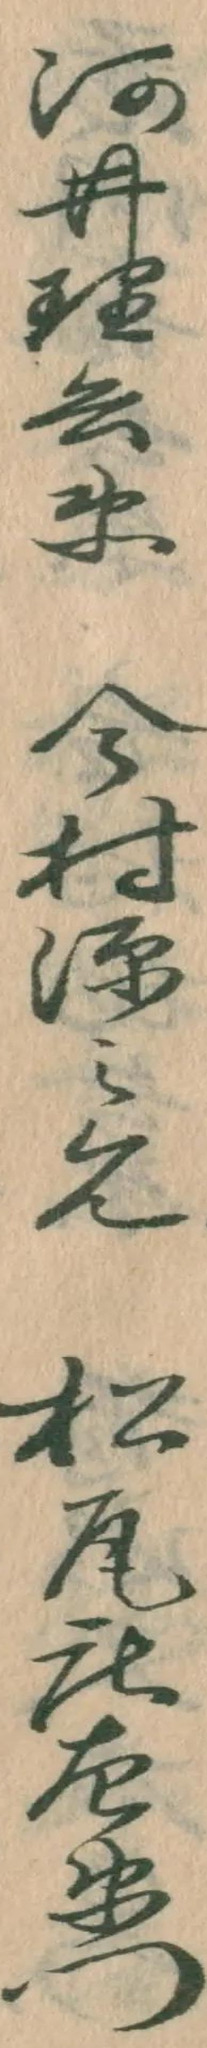河井理兵衛今村源之允松尾庄左衛門
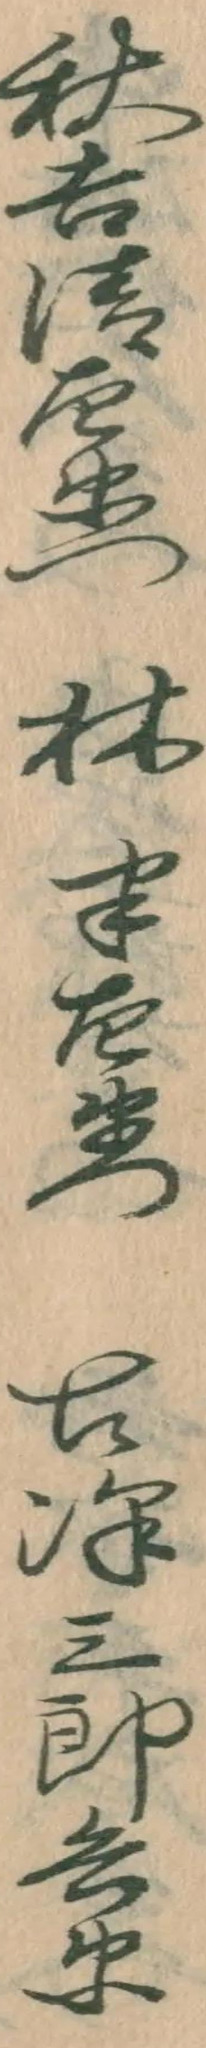秋吉清左衛門林半左衛門古沢三郎兵衛
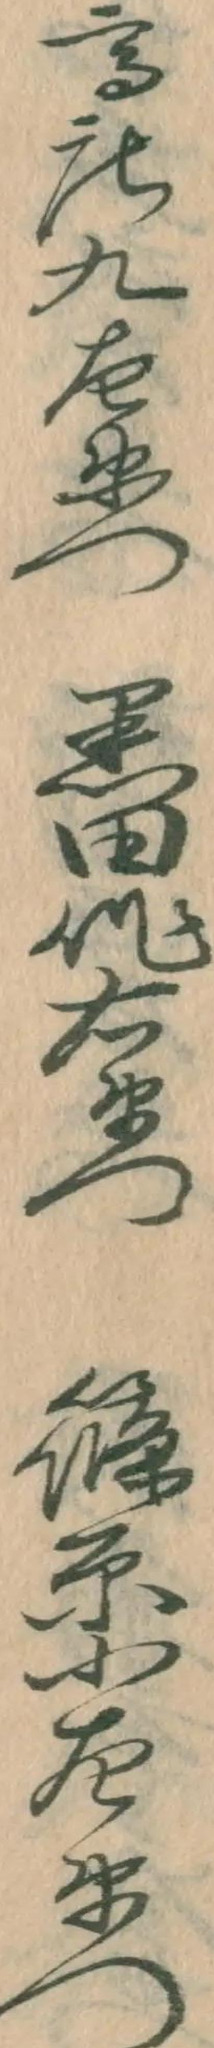高庄九左衛門黒田作右衛門篠原小左衛門

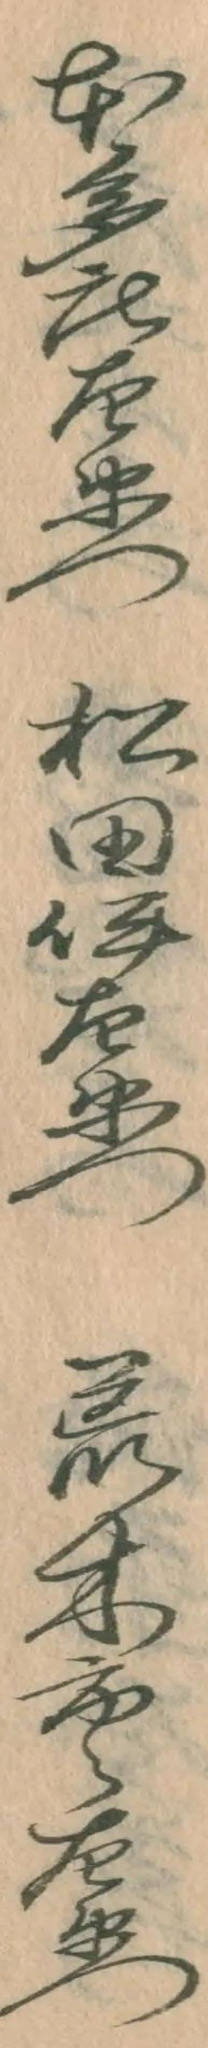本多庄左衛門松田伊左衛門荒木市郎左衛門
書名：切支丹御退治記 49巻. [9]
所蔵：国立国会図書館 National Diet Library, JAPAN
